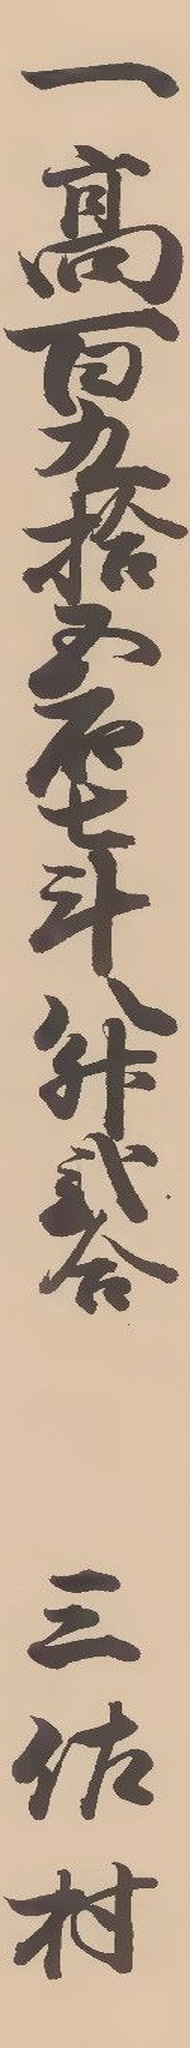一高百九拾五石七斗八升弐合三佐村
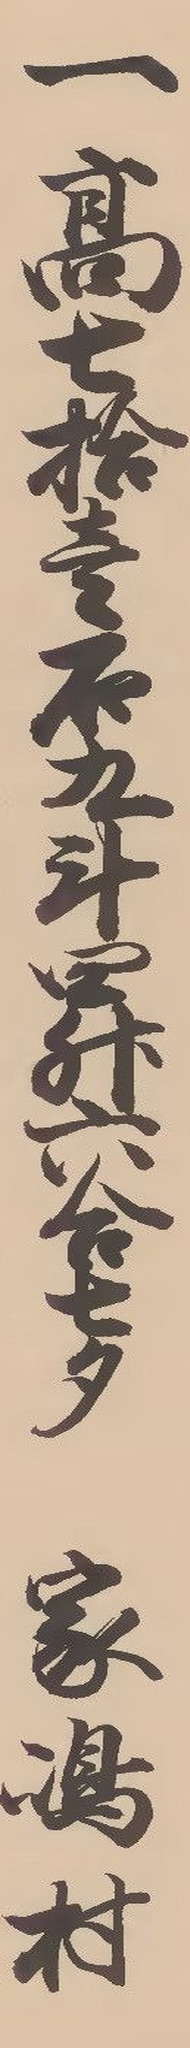一高七拾壱石九斗四升六合七勺家島村
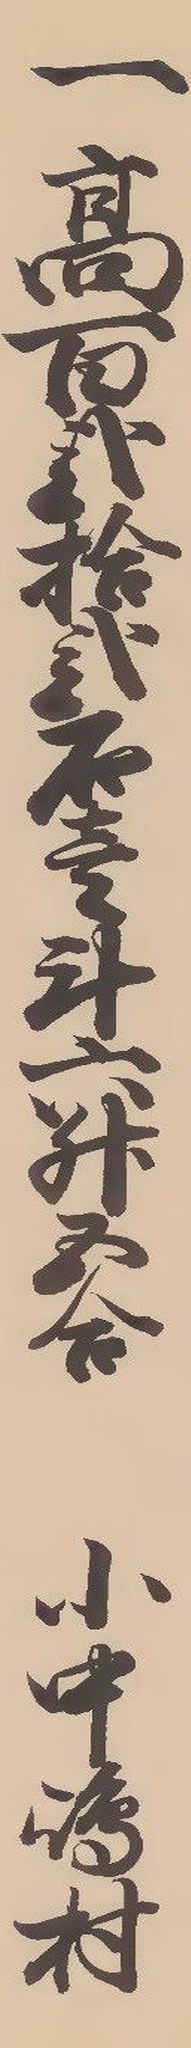一高百弐拾弐石壱斗六升五合小中島村
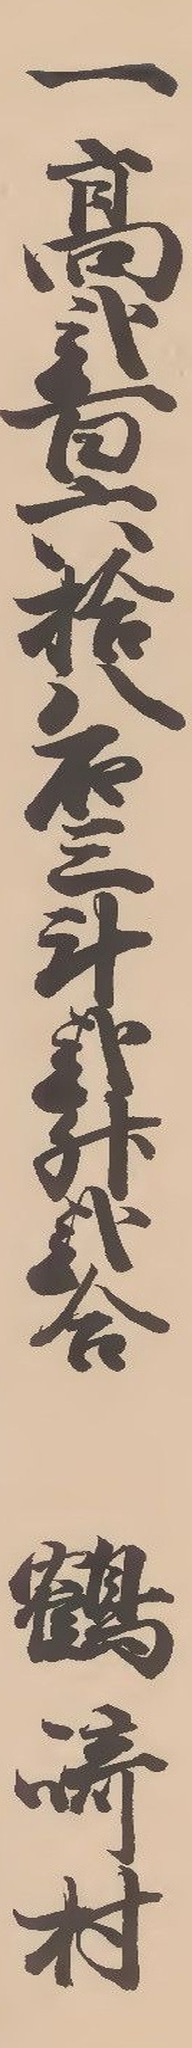一高弐百六拾八石三斗弐升弐合鶴崎村
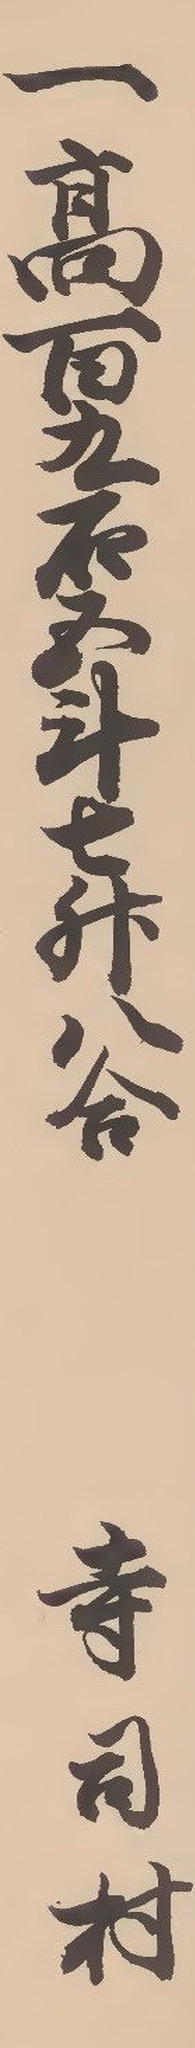一高百九石五斗七升八合寺司村
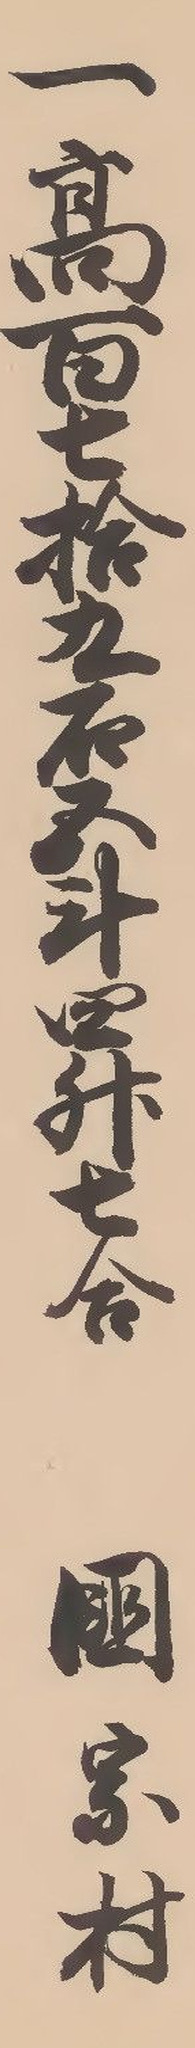一高百七拾九石五斗四升七合国宗村
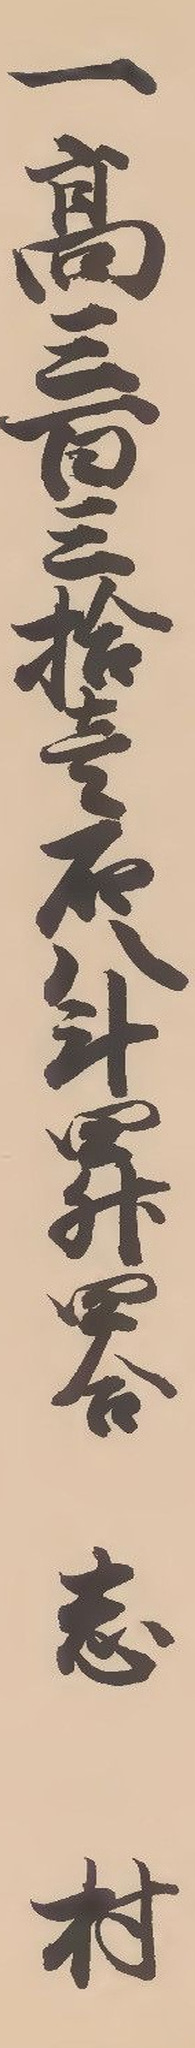一高三百三拾壱石八斗四升四合志村
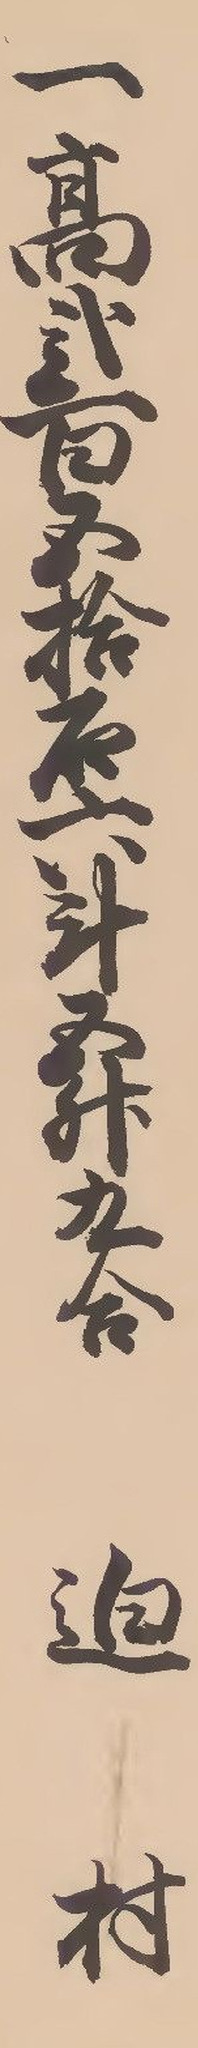一高弐百五拾石六斗五升九合迫村

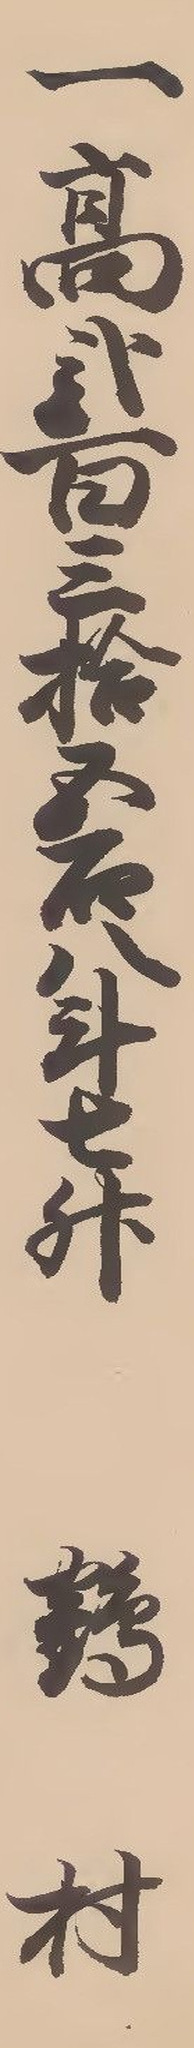一高弐百三拾五石八斗七升鶴村
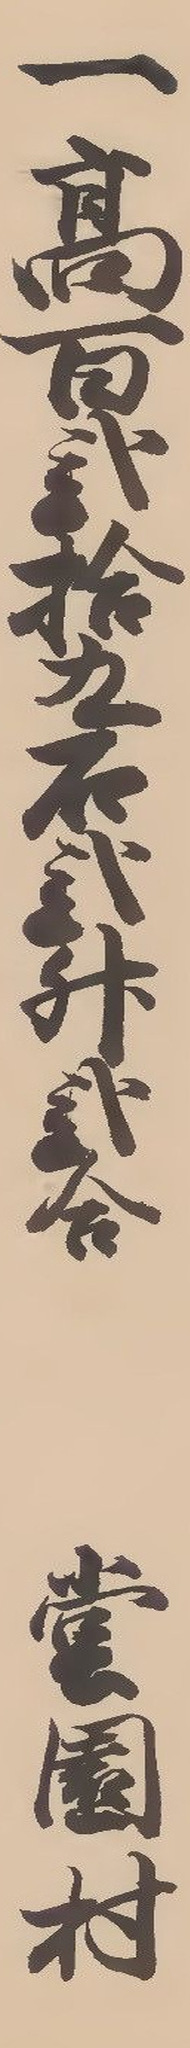一高百弐拾九石弐升弐合堂園村
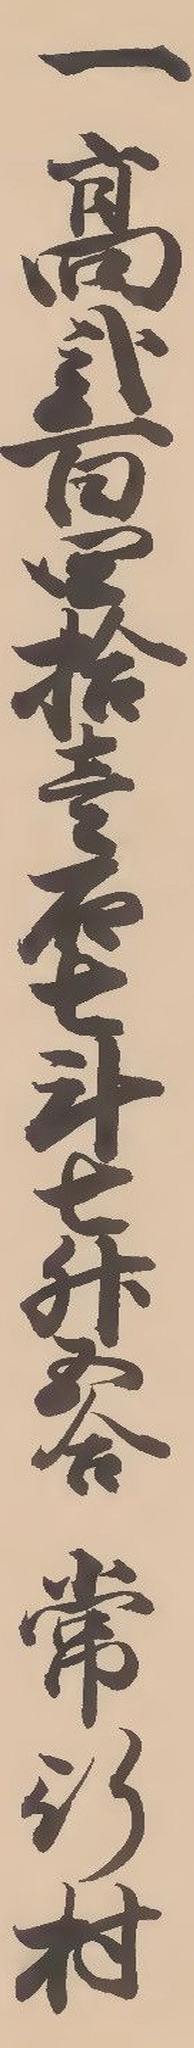一高弐百四拾壱石七斗七升五合常行村
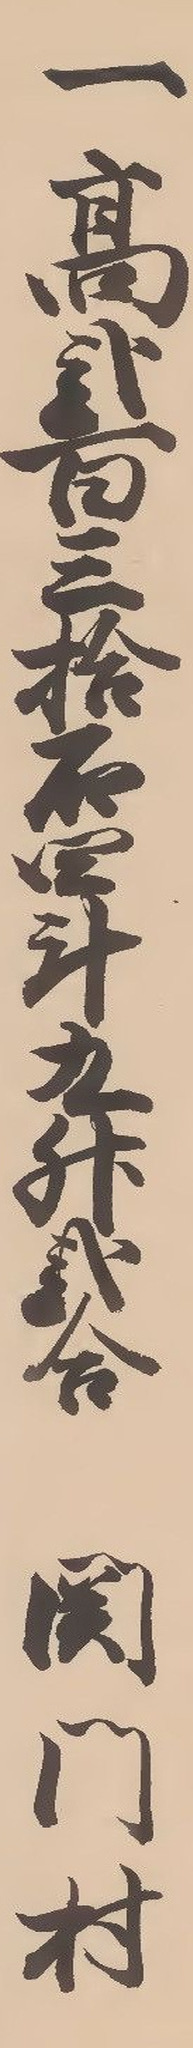一高弐百三拾石四斗九升弐合関門村
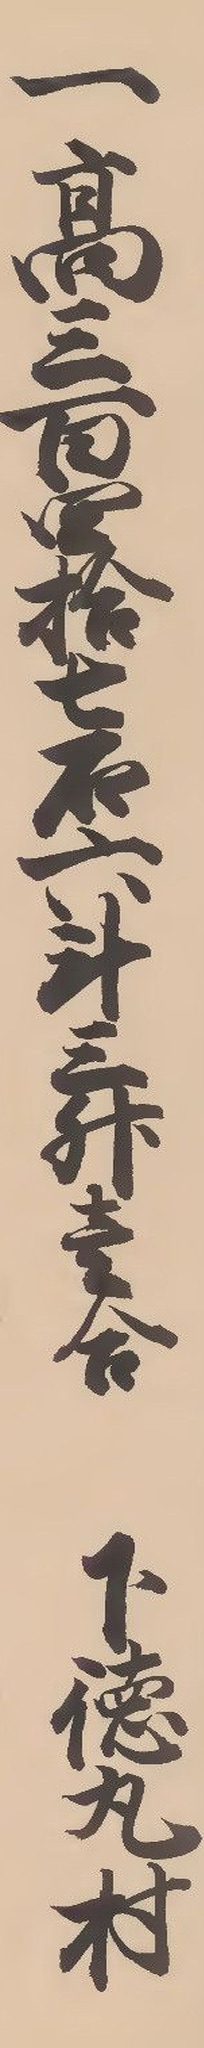一高三百四拾七石六斗三升壱合下徳丸村
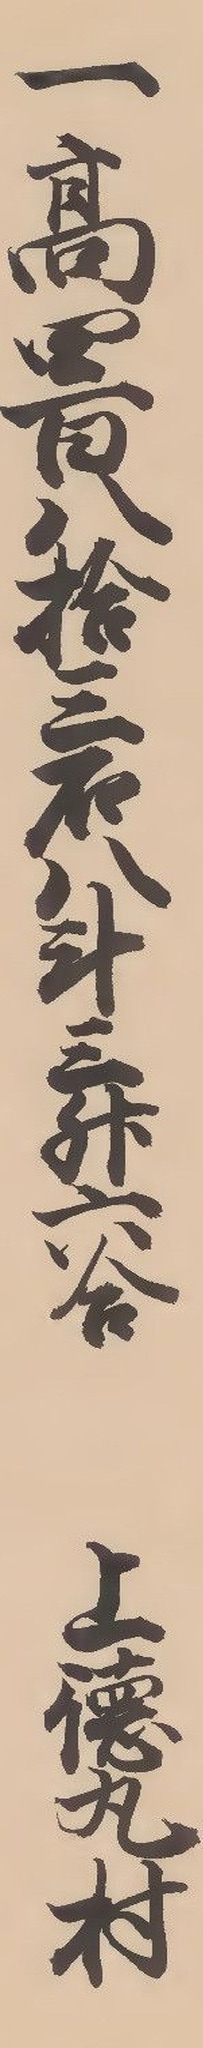一高四百八拾三石八斗三升六合上徳丸村
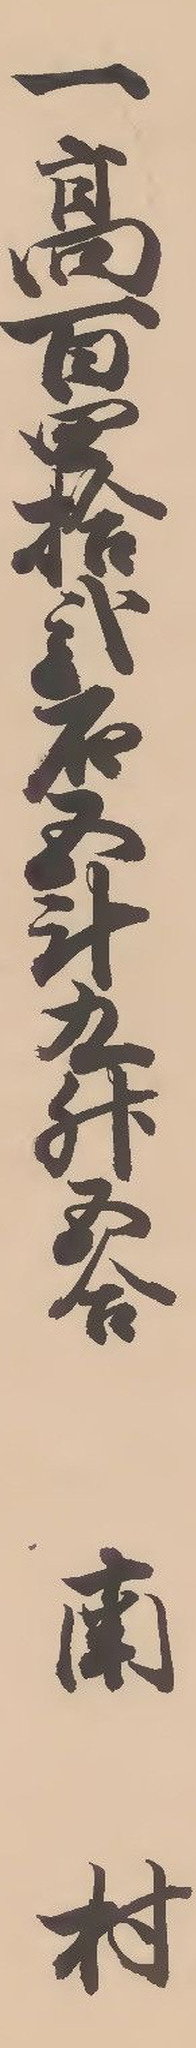一高百四拾弐石五斗九升五合南村
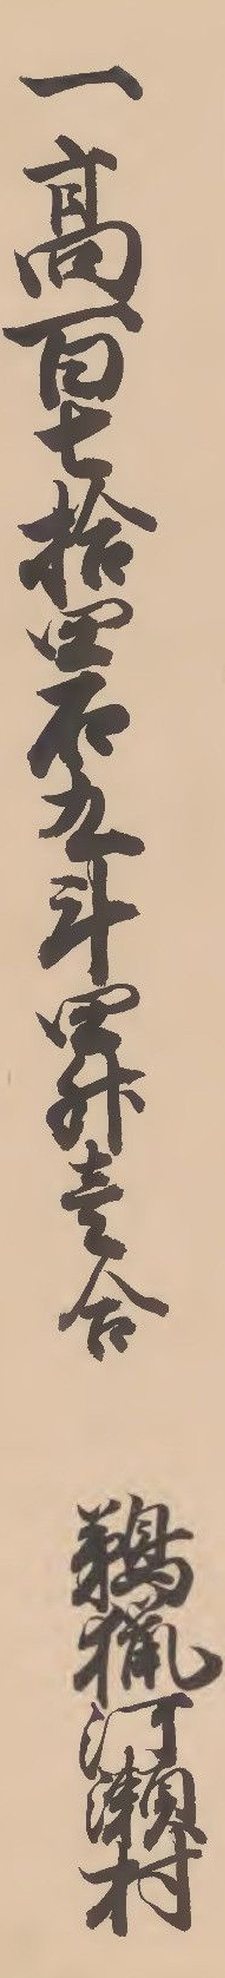一高百七拾四石九斗四升壱合鵜猟河瀬村
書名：豊後国郷帳
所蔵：国立公文書館 National Archives of Japan
